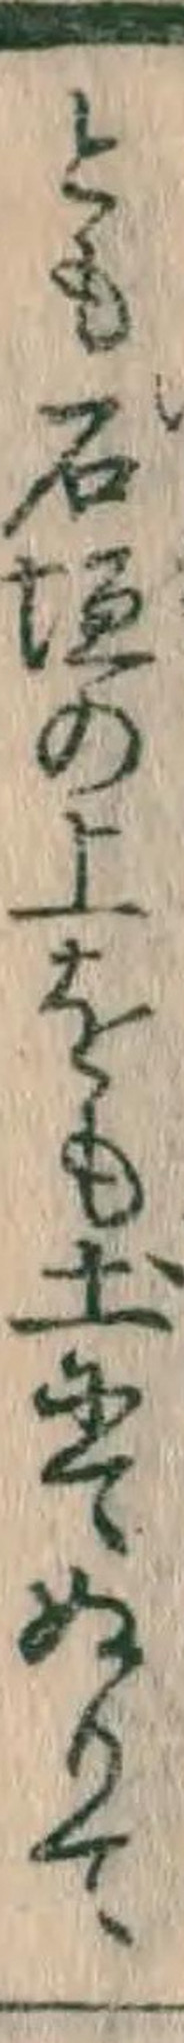とも石垣の上をも土にてぬりて
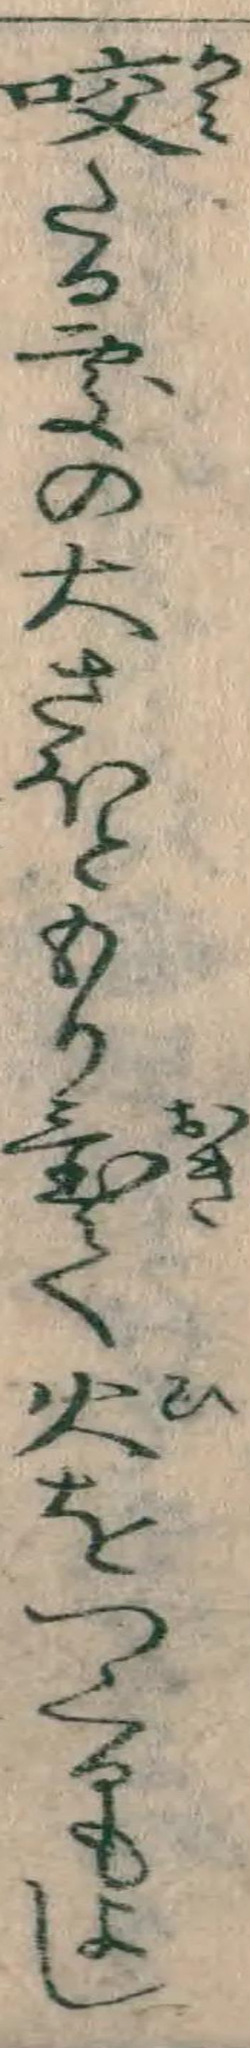咬たる處の大さほともり置て火をつくるもよし
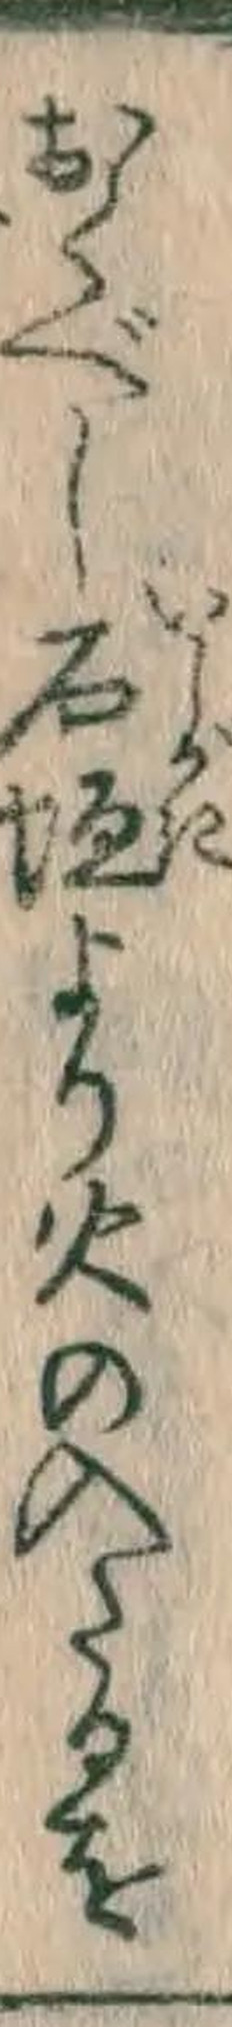おくべし石垣より火の入たるを
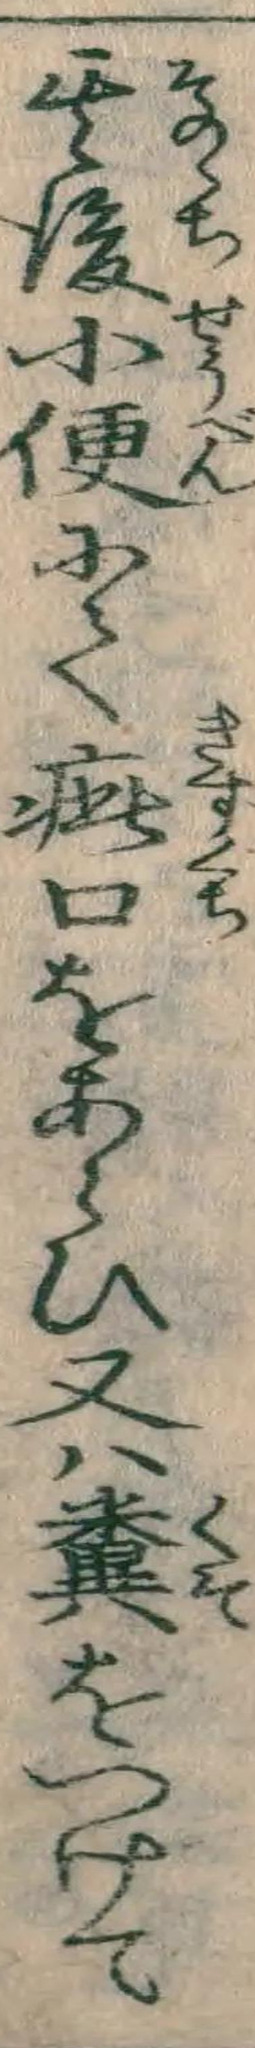其後小便にて疵口をあらひ又は糞をつけて
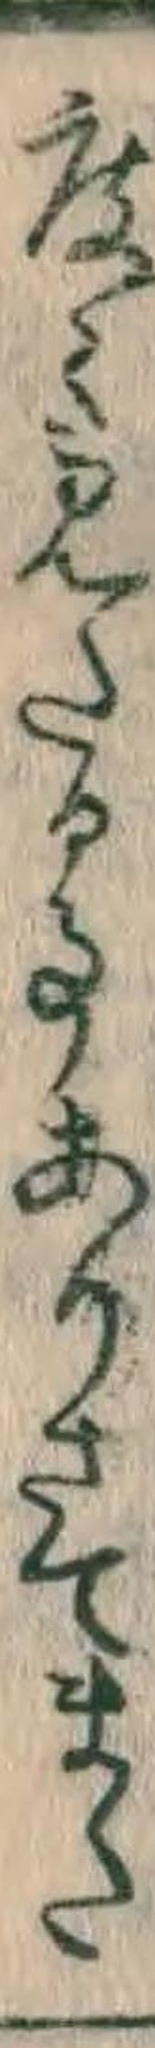度々見たる事ありさてまた
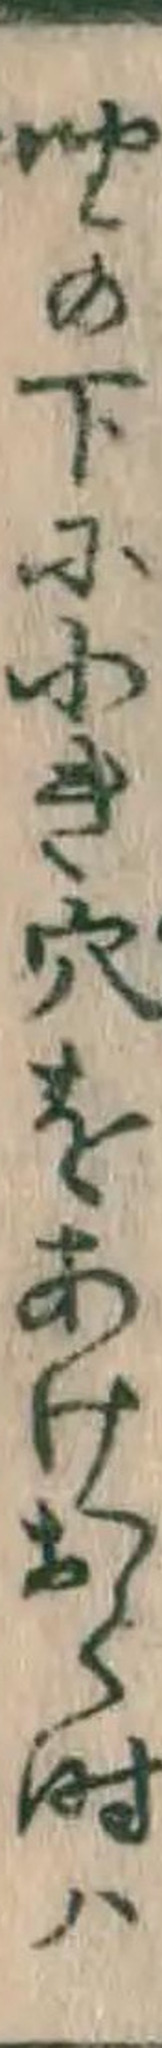坐の下に小き穴をあけおく時は
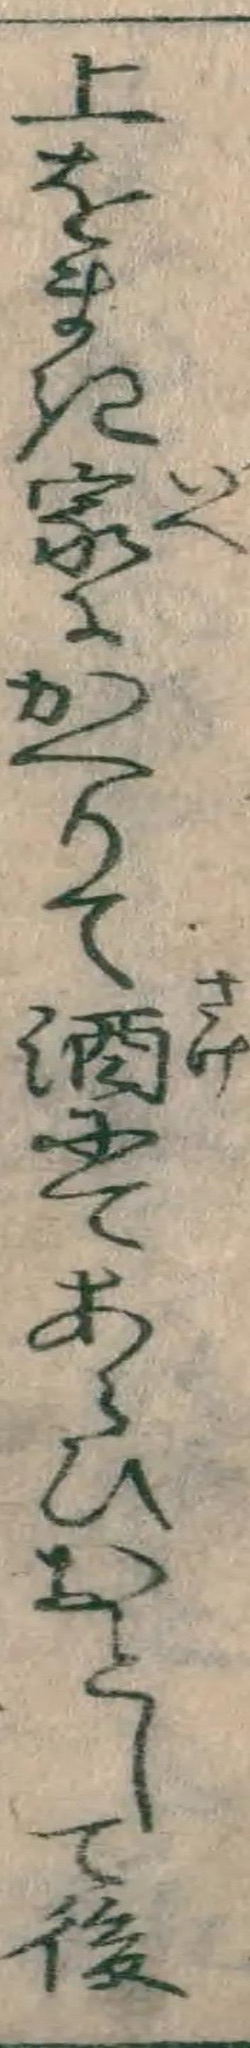上をまき家にかへりて酒にてあらひおとして後
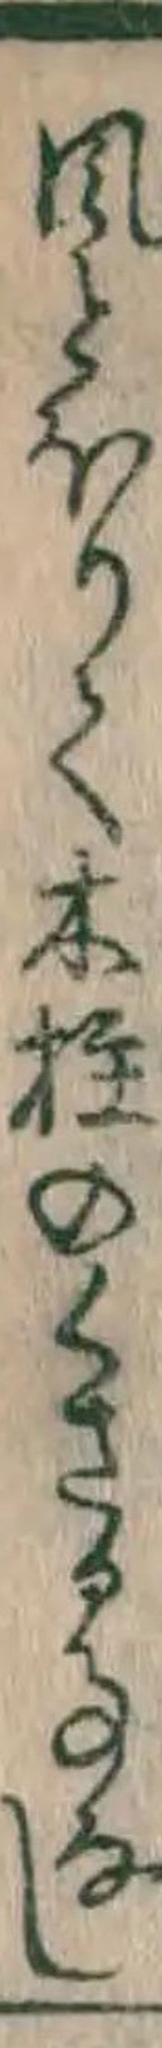風とほりて木柱のくさる事なし
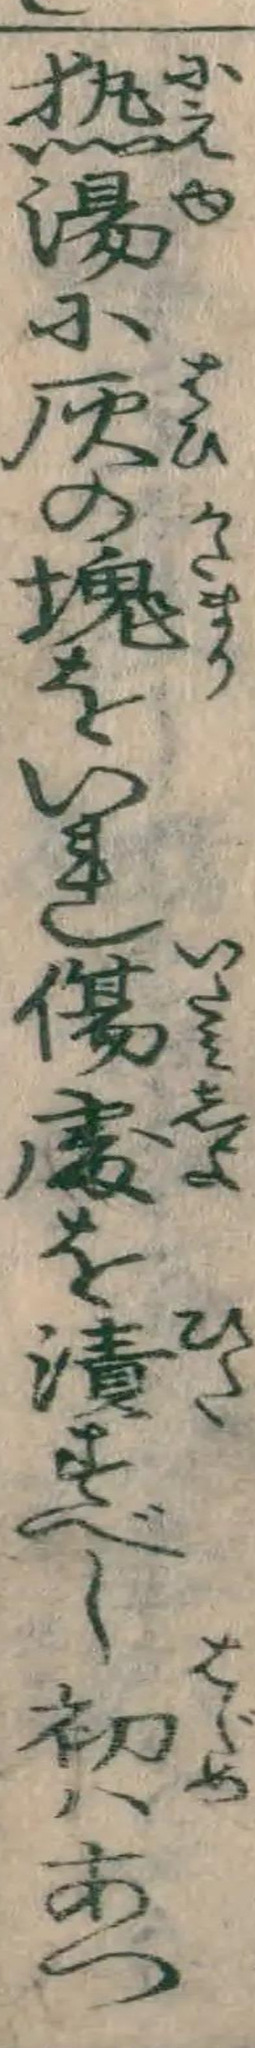熱湯に灰の塊をいれ傷處を漬すべし初はあつ

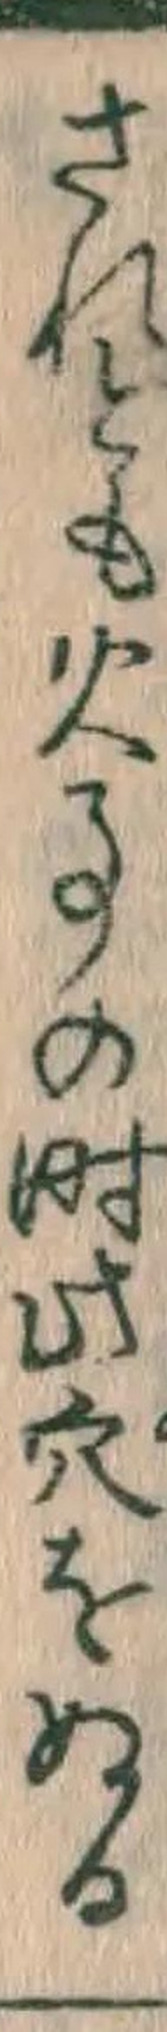されども火事の時此穴をぬる
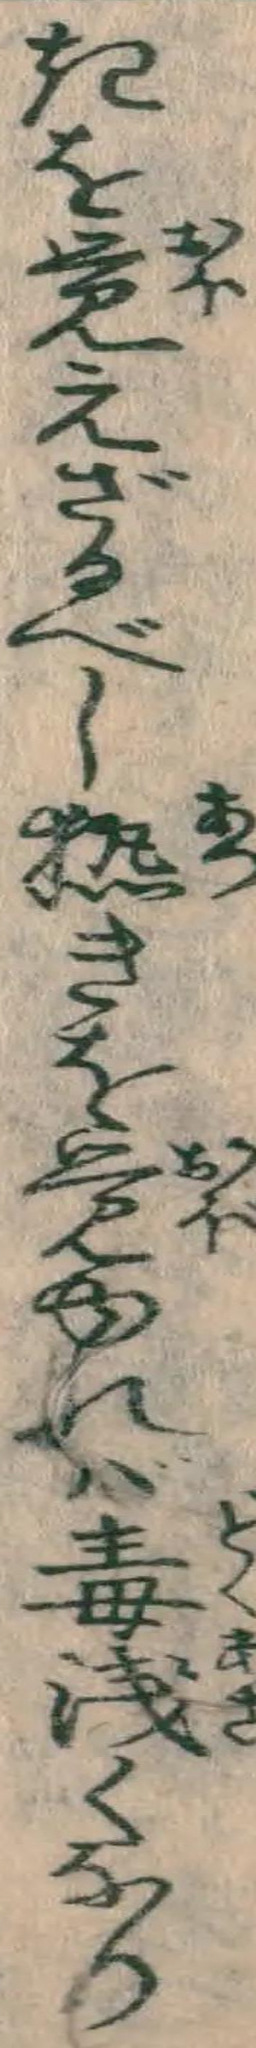きを覚えざるべし熱きを覚ゆれば毒浅くなり
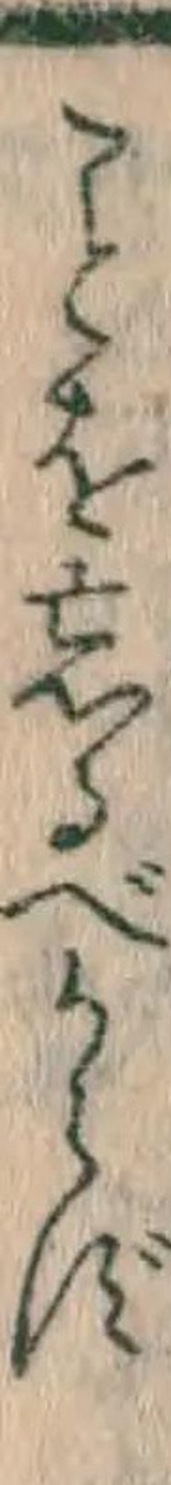ことを忘るべからず
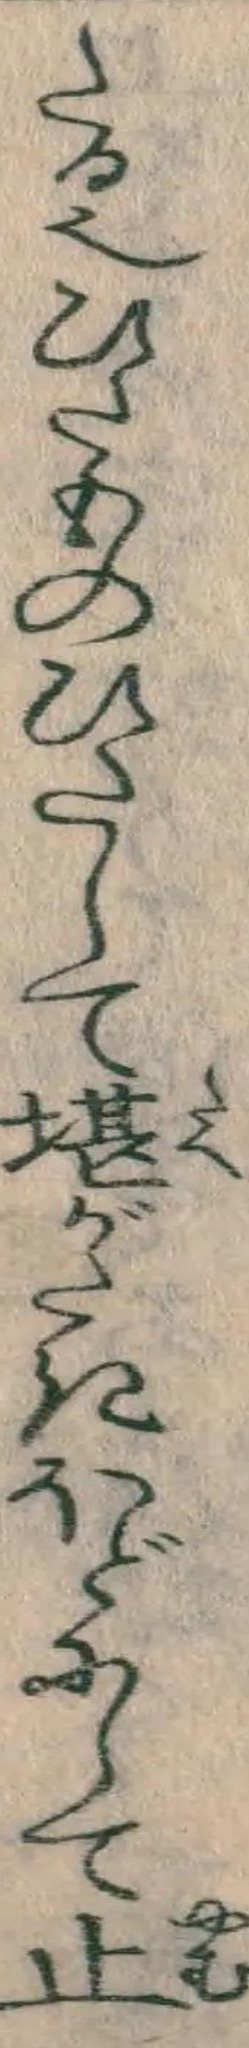たる也ひたものひたして堪がたきほどにして止
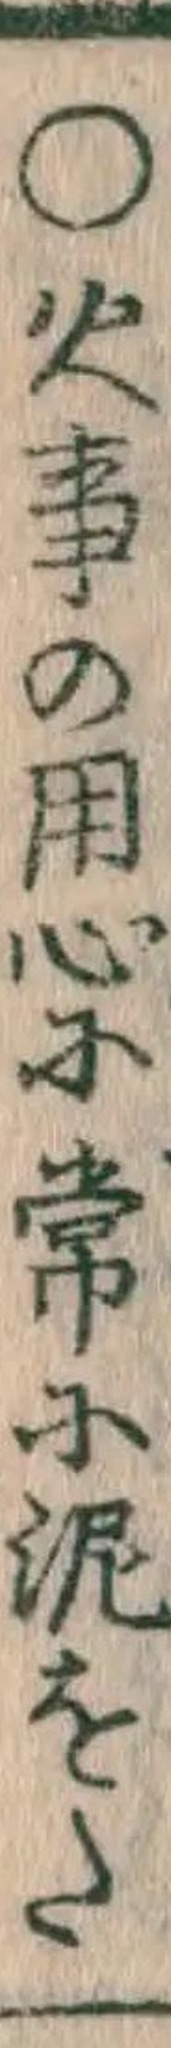○火事の用心に常に泥をた
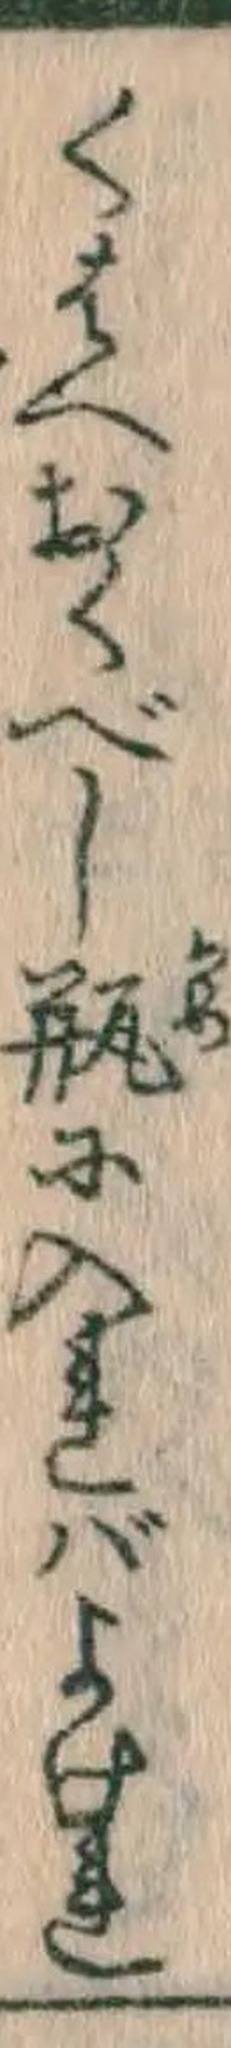くはへおくべし瓶入ればよけれ
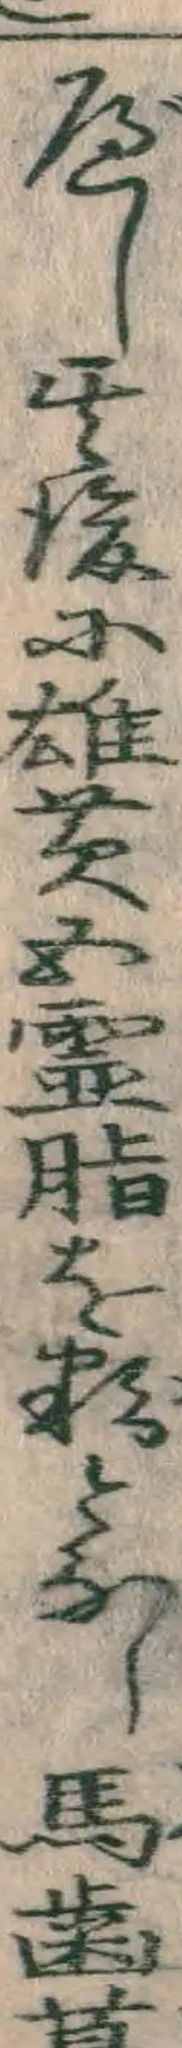べし其後に雄黄五霊脂を粉となし馬歯莧
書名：広益秘事大全 3巻. [3]
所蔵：国立国会図書館 National Diet Library, JAPAN
